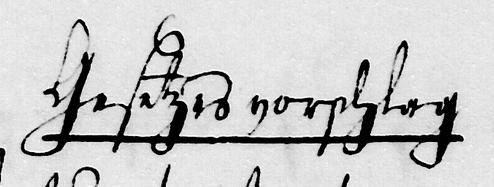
Gesetzesvorschlag
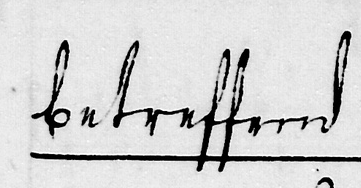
betreffend
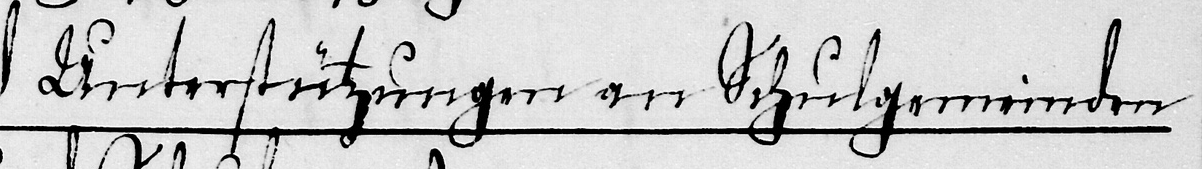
Unterstützungen an Schulgemeinden
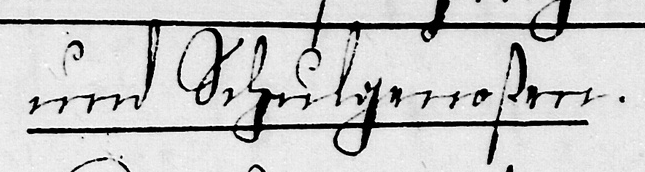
und Schulgenoßen.
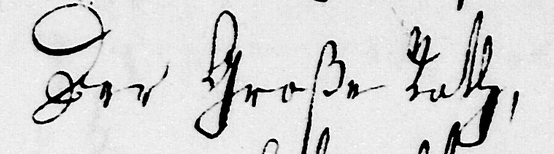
Der Große Rath,
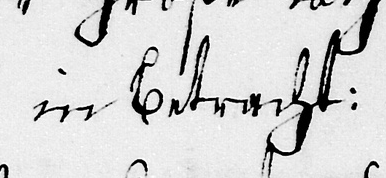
in Betracht:
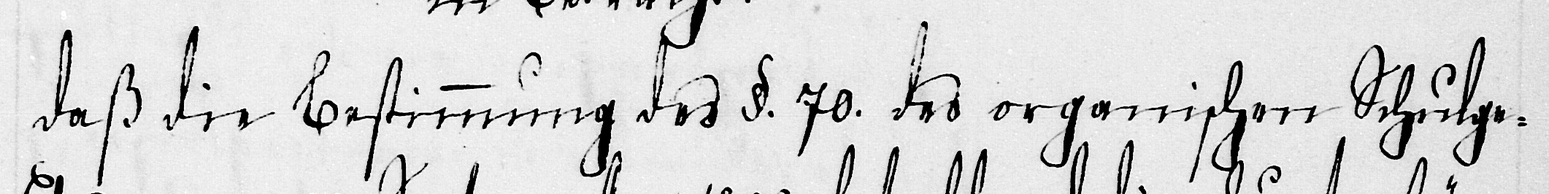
daß die Bestimmung des §. 70. des organischen Schulge¬
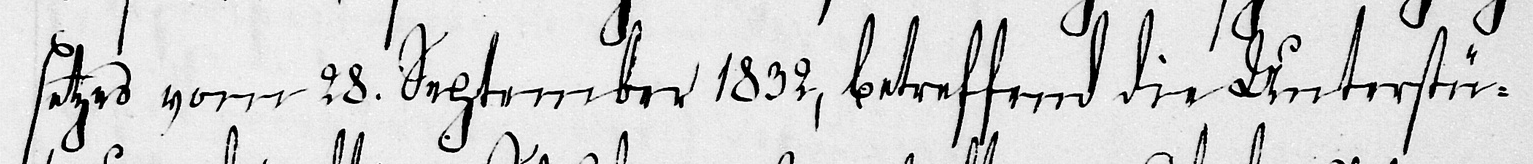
setzes vom 28. September 1832, betreffend die Unterstü¬
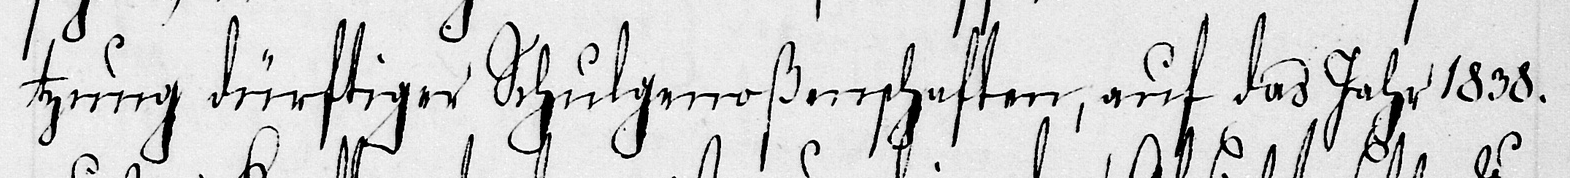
tzung dürftiger Schulgenoßenschaften, auf das Jahr 1838.
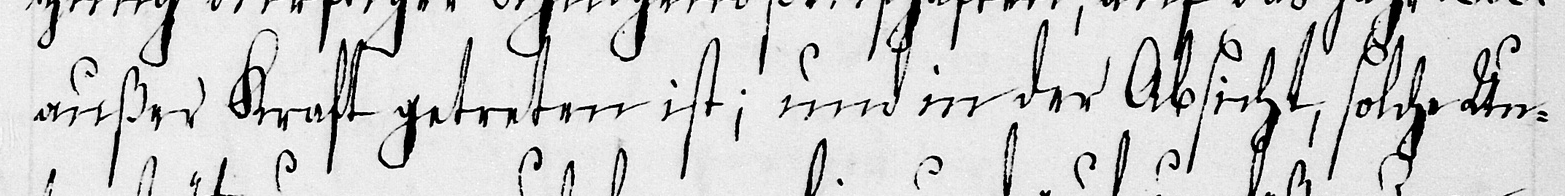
außer Kraft getreten ist; und in der Absicht, solche Un¬
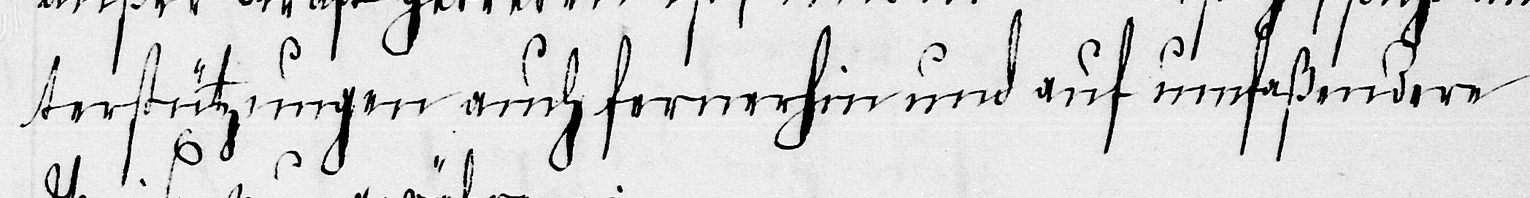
terstützungen auch fernerhin und auf umfaßendere
